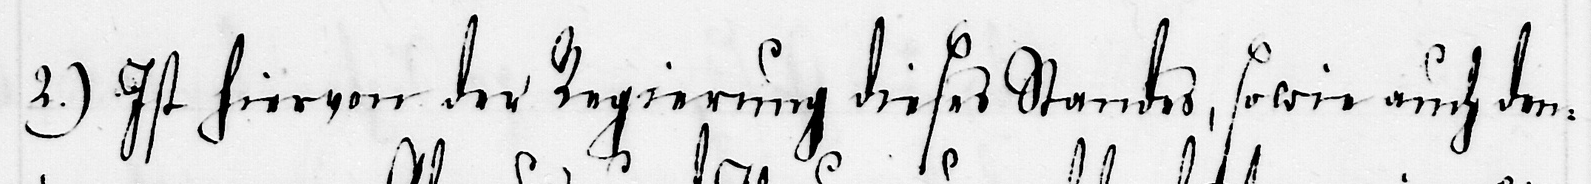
2.) Ist hiervon der Regierung dieses Standes, sowie auch den¬
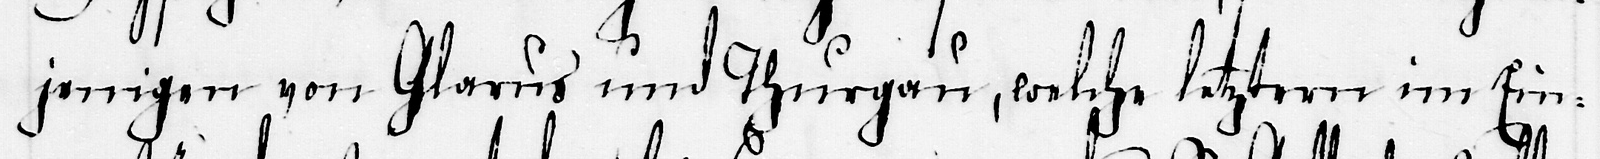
jenigen von Glarus und Thurgau, welche letztern im Ein¬
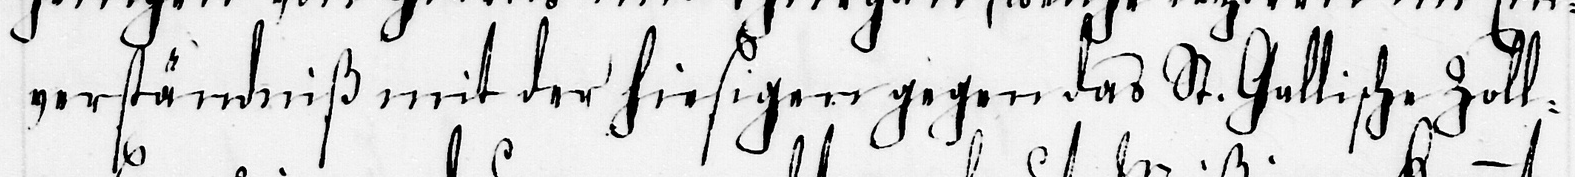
verständniß mit der hiesigen gegen das St. Gallische Zoll¬
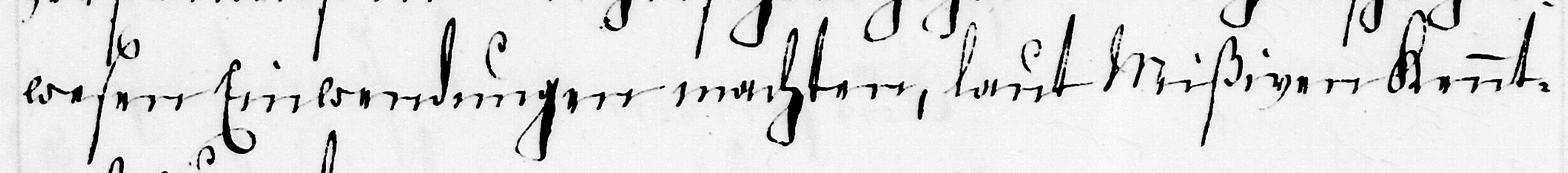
wesen Einwendungen machten, laut Mißiven Kennt¬
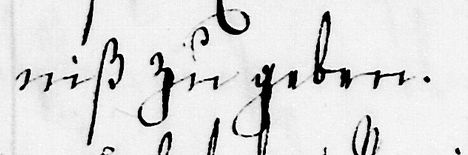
niß zu geben.
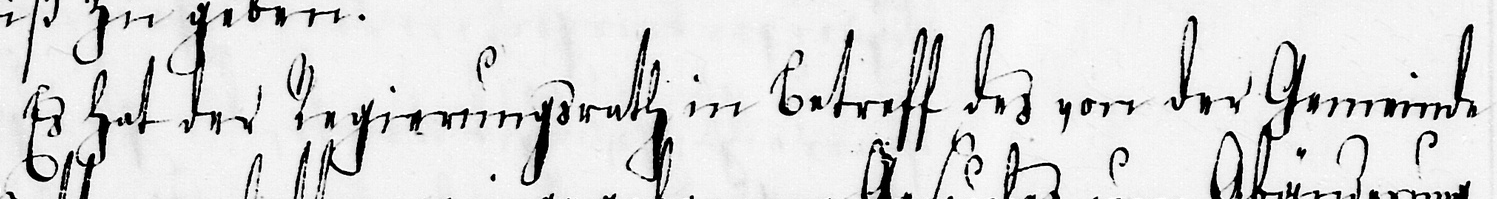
Es hat der Regierungsrath in Betreff des von der Gemeinde
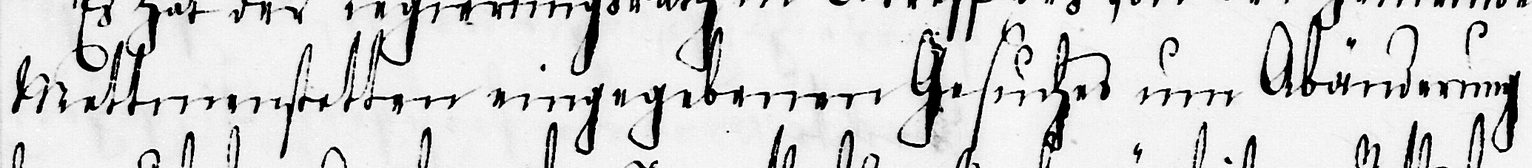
Mettmenstetten eingegebenen Gesuches um Abänderung
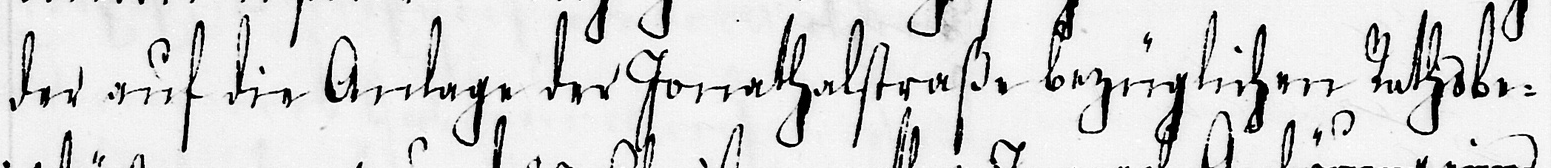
der auf die Anlage der Jonathalstraße bezüglichen Rathsbes¬
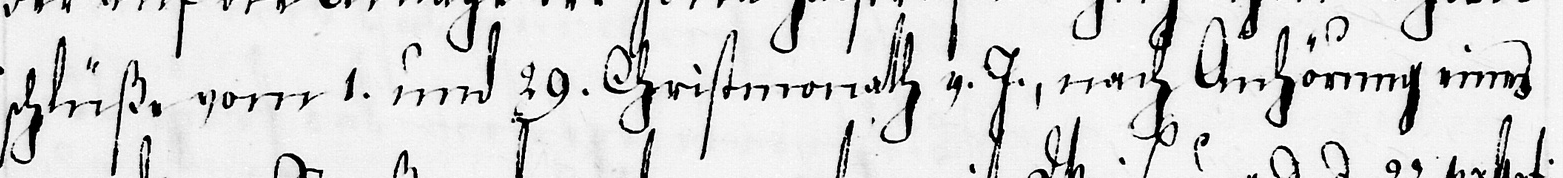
chlüße vom 1. und 29. Christmonath v. J., nach Anhörung eines
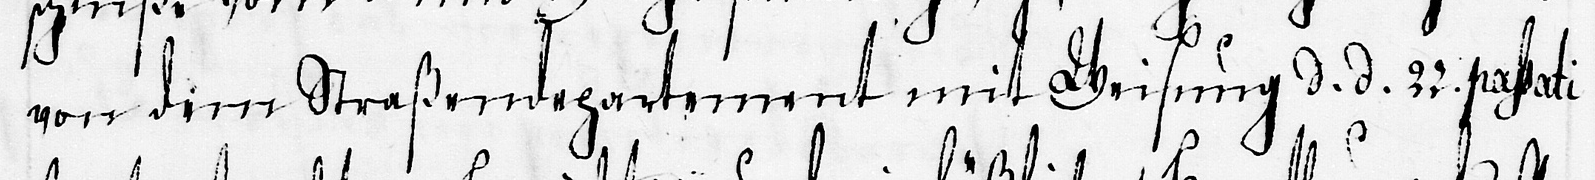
von dem Straßendepartement mit Weisung d. d. 22. pas¬
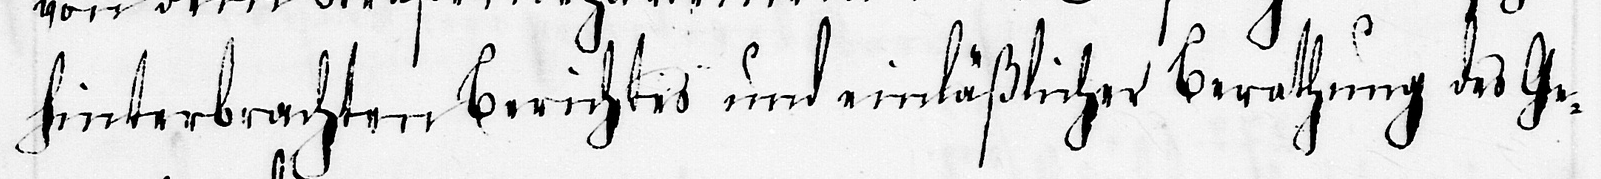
hinterbrachten Berichtes und einläßlicher Berathung des Ge¬
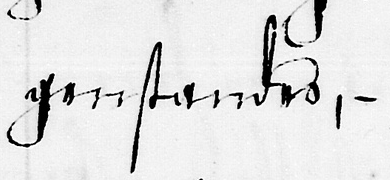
genstandes, –
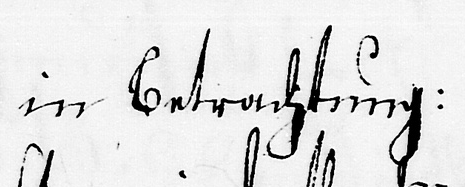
in Betrachtung:
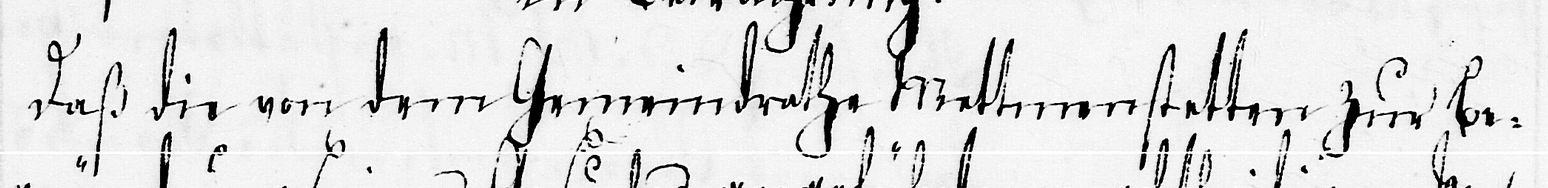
Daß die von dem Gemeindrathe Mettmenstetten zur Be¬
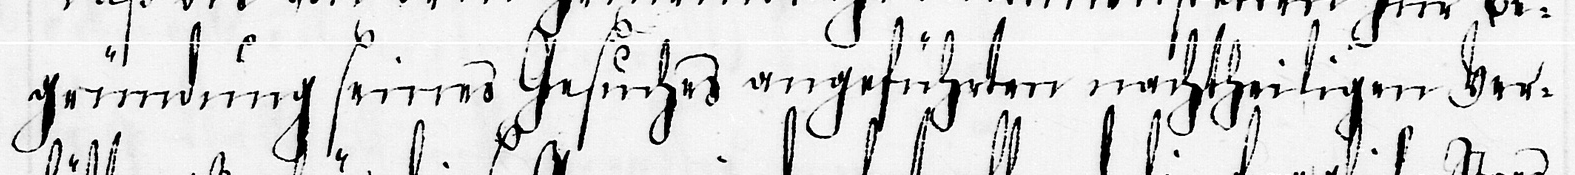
gründung seines Gesuches angeführten nachtheiligen Ver¬
